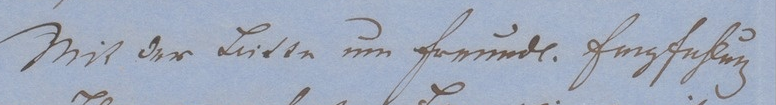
Mit der Bitte um freundl. Empfehlung
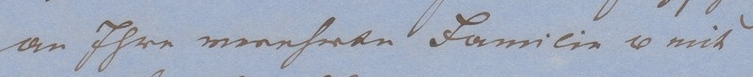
an Ihre verehrte Familie & mit
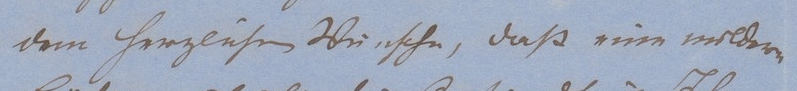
dem herzlichen Wunsche, daß eine mildere
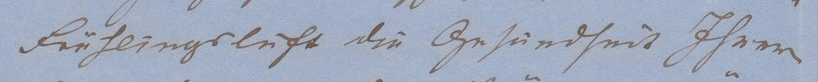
Frühlingsluft die Gesundheit Ihrer
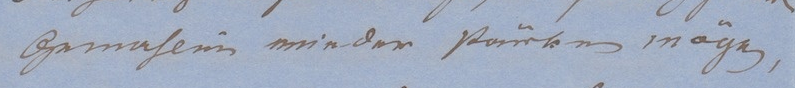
Gemahlin wieder stärken möge,
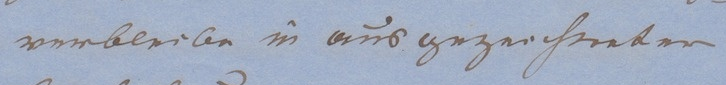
verbleibe in ausgezeichneter
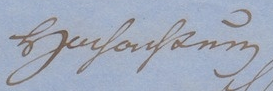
Hochachtung
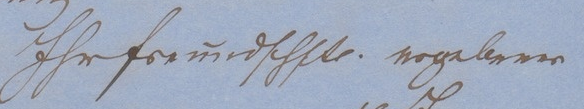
Ihr freundschftl. ergebener
